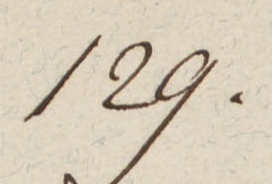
129.
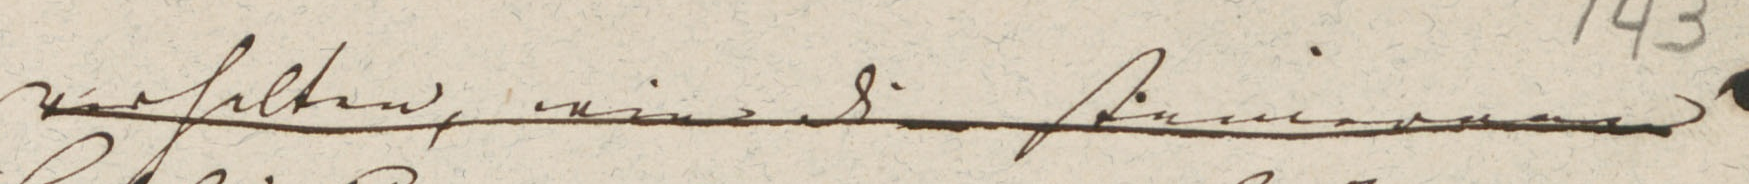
verhalten, wie die steinernen
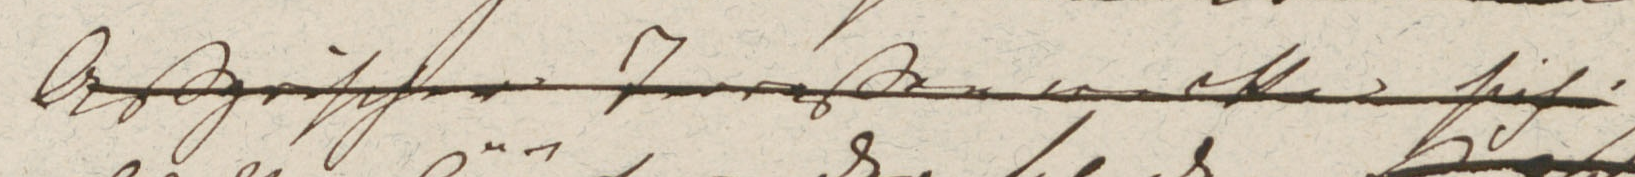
Assyrischer Terrassenwerke sich
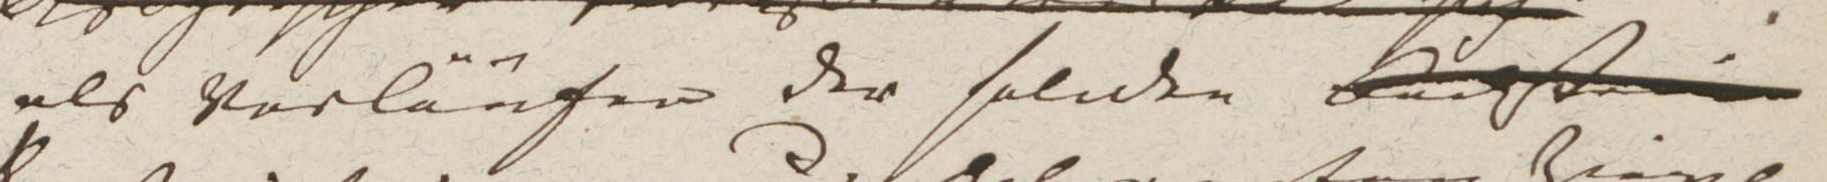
als orläufer der soliden Backstein
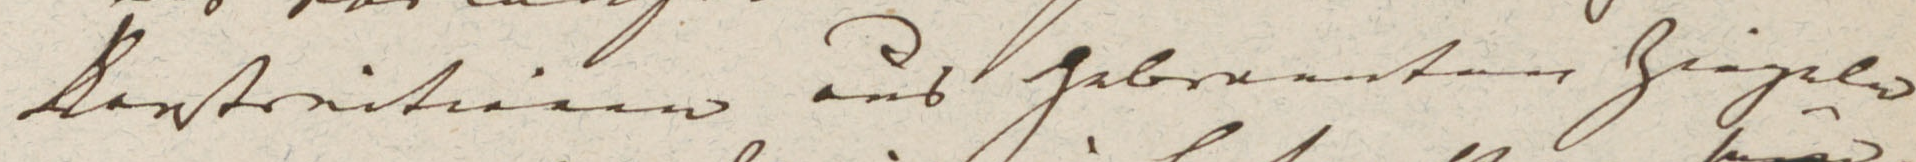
CKonstructionen aus gebrannten Ziegeln
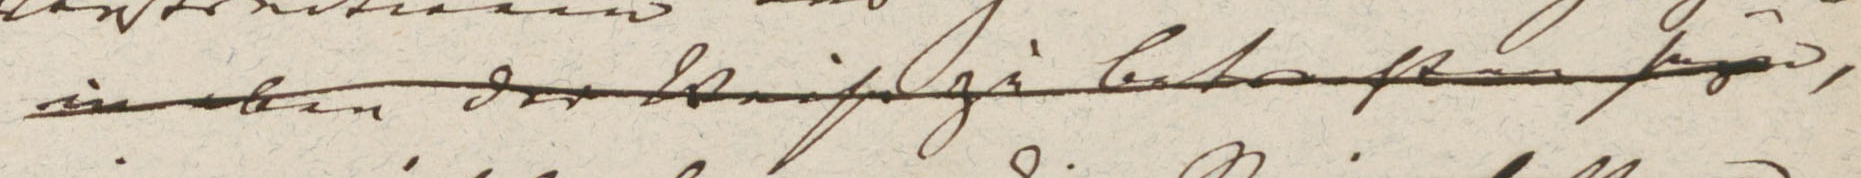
in eben der Weise zu betrachten seyn,
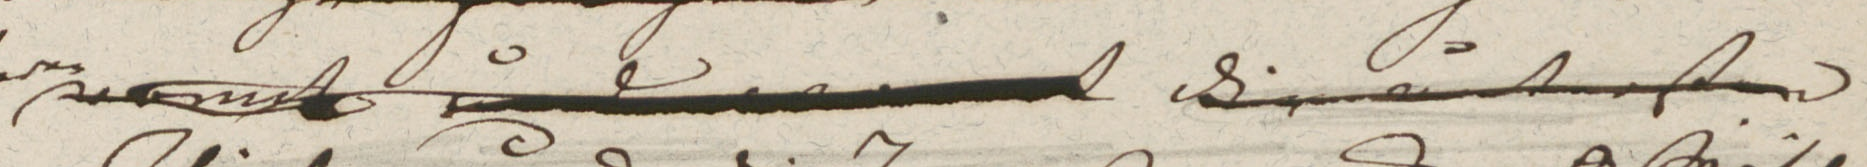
womit und womit die untersten
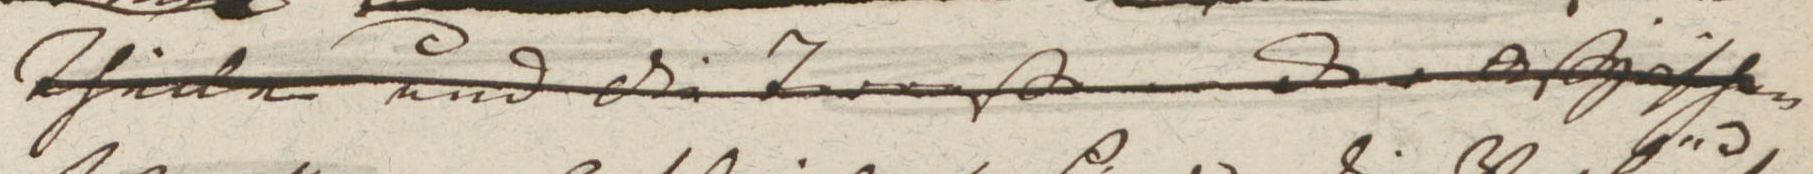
Theile und die Terrasse der Assyrischen
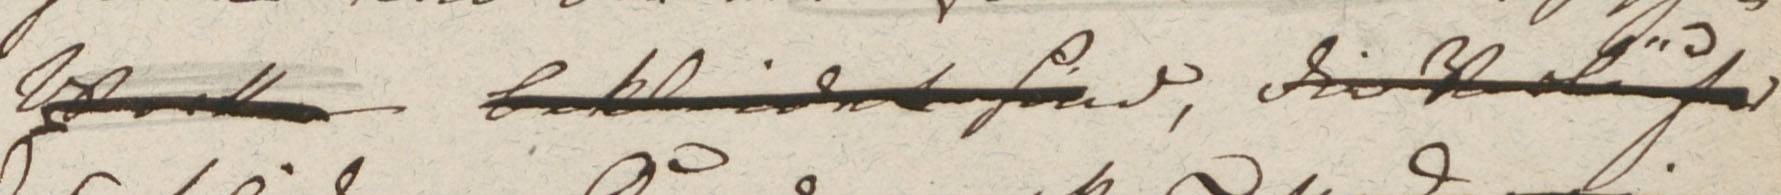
Werke bekleidet sind, die Vorläufer
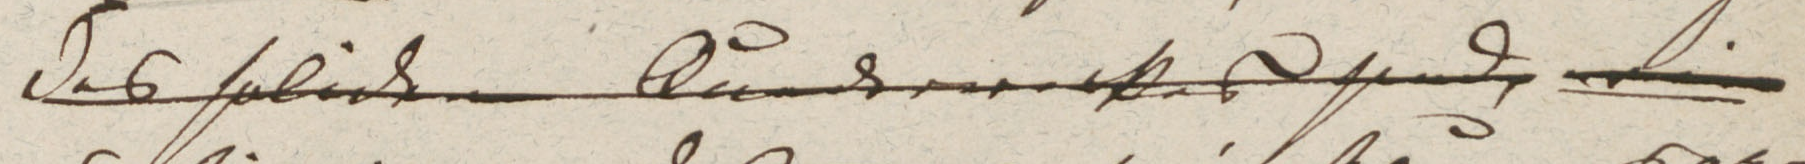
des soliden Quaderwerkes sind, wie
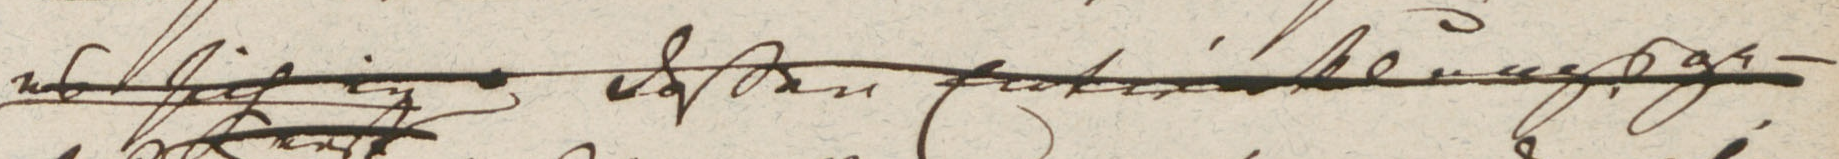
es sich in dessen Entwicklungsge-
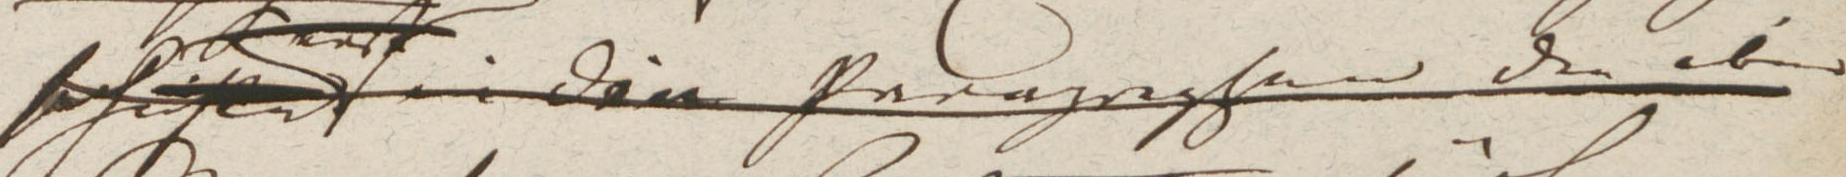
schichte erst in dien Paragraphen die über
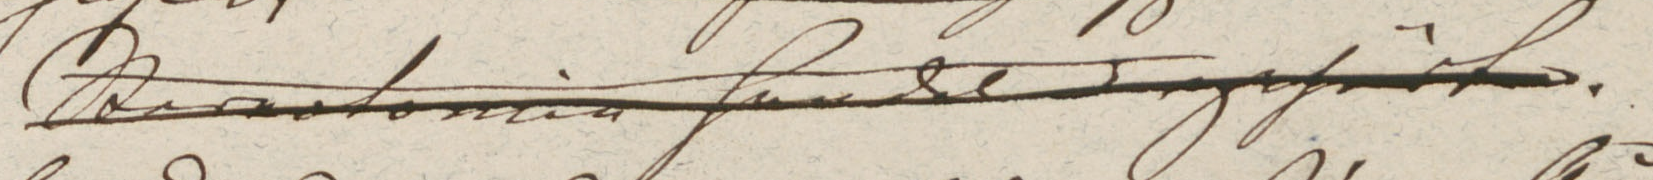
Stereotomie handln gehört.
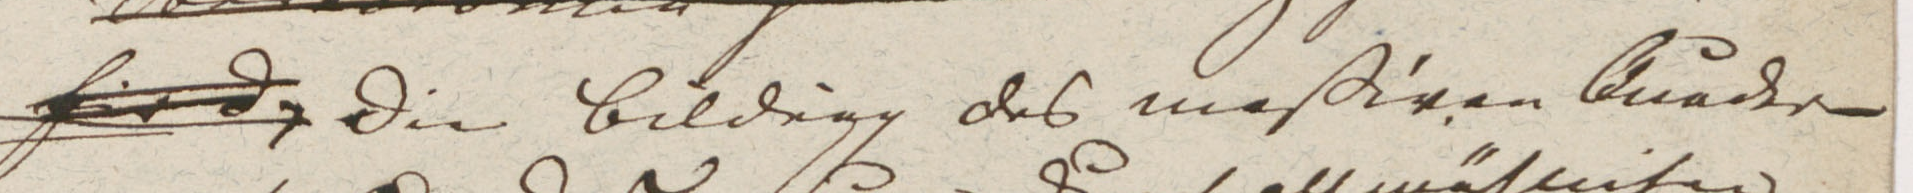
für d% die Bildung des massiven Quader-
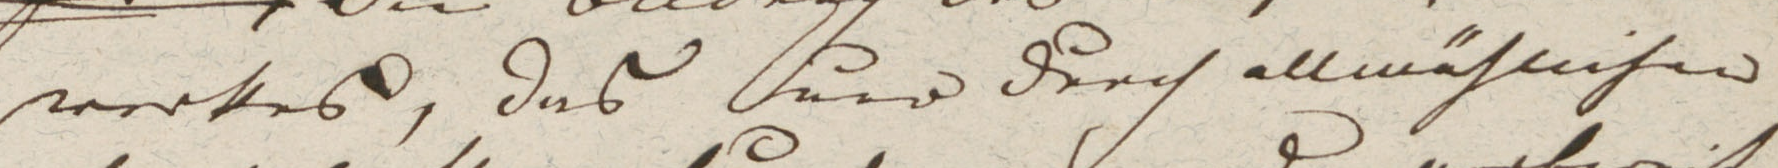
werkes, das nur durch allmählichen
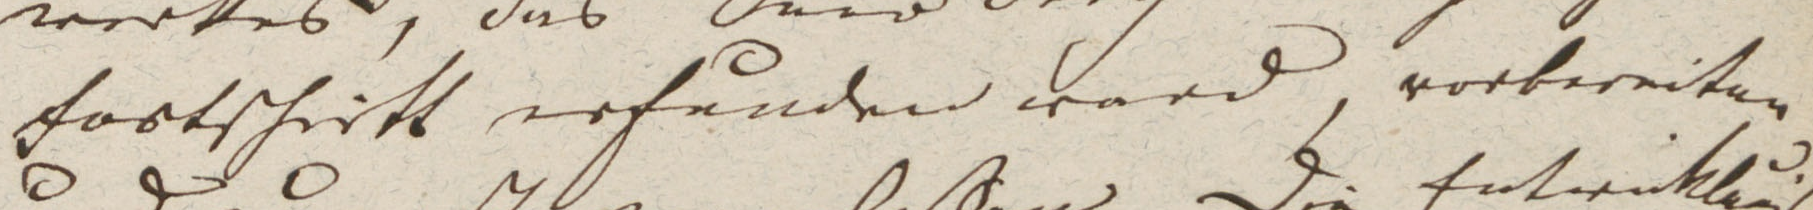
Fortschritt erfunden ward, vorbereiten
